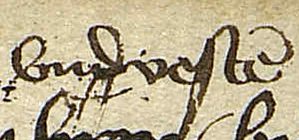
vnd veſte*
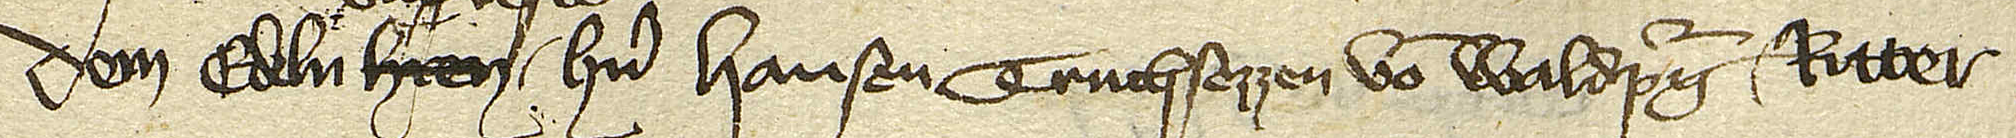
Dem Edeln hren / hn* hanſen Truchſeʒʒen vo* waldp*g / Ritter
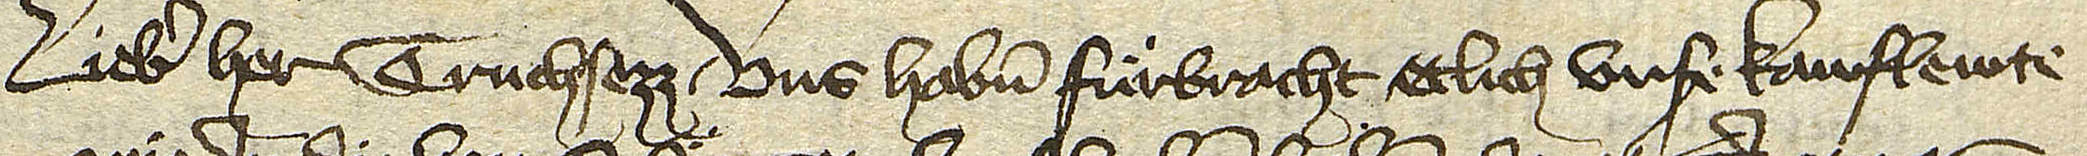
Lieb* her Truchſeʒʒ / Vns habn* fürbracht etlich vnſ*e Kauflewte
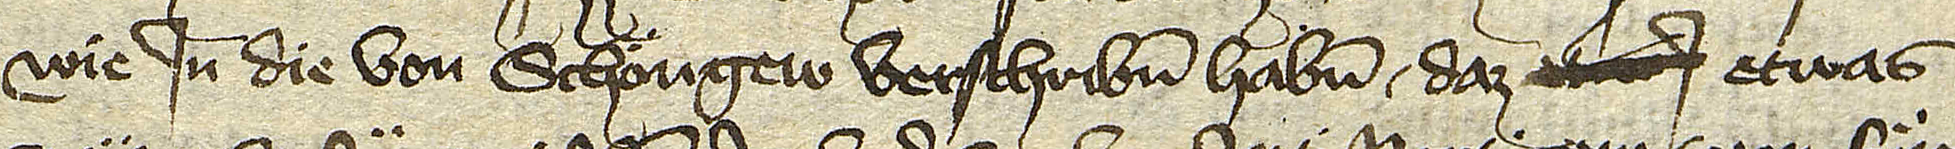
wie In die von Schöngew verſchribn* habn* / daʒ etw I etwas
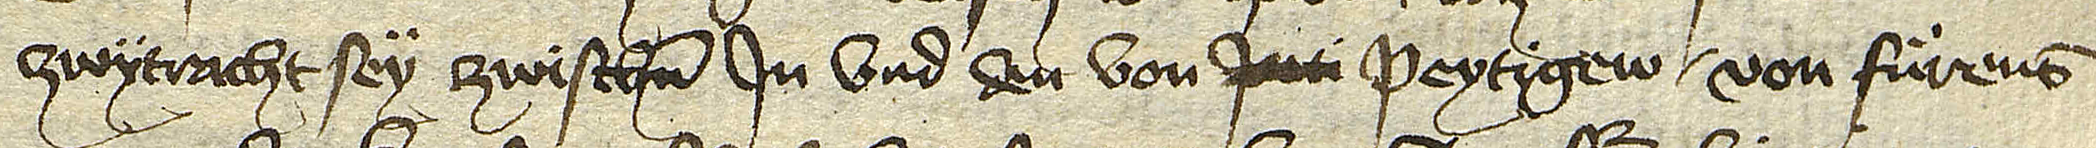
cʒwytracht ſey cʒwiſchn* In vnd den von Peti Peytigew / von fürens
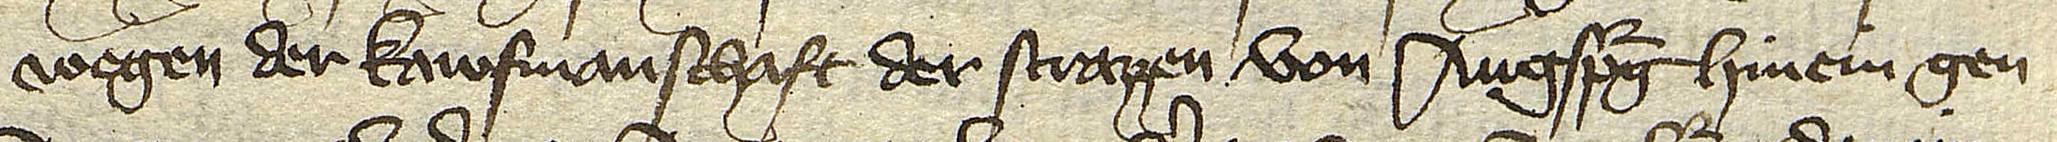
wegen der kawfmanſchaft der ſtraʒʒen / von Augſp*g hinein gen
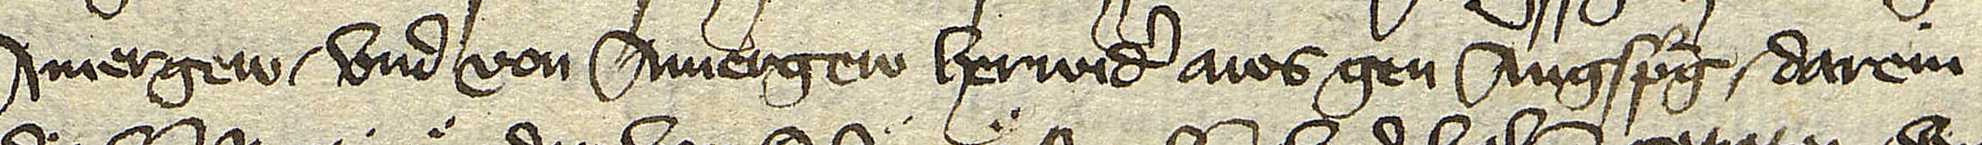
Amergew / vnd von Amergew herwid* aws gen Augſp*g / darein
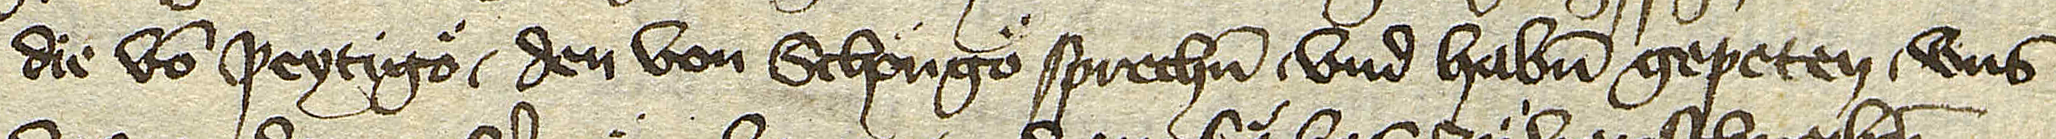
die vo* peytigö / den von Schöngö ſprechn* / vnd habn* gepeten / vns
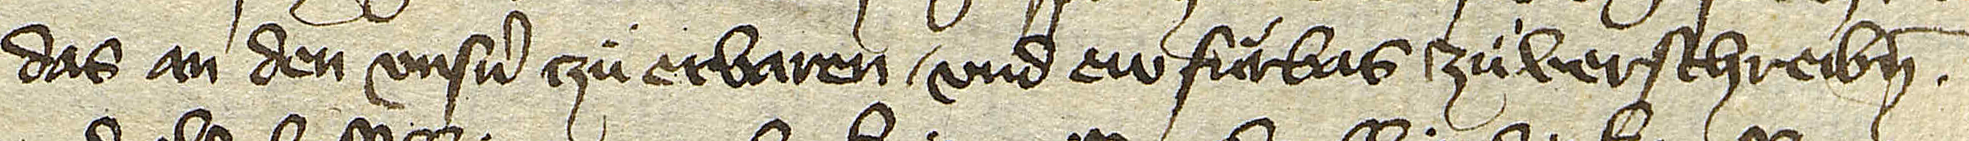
das an den vnſn* cʒü ervaren / vnd ew fürbas cʒü verſchreibn* .
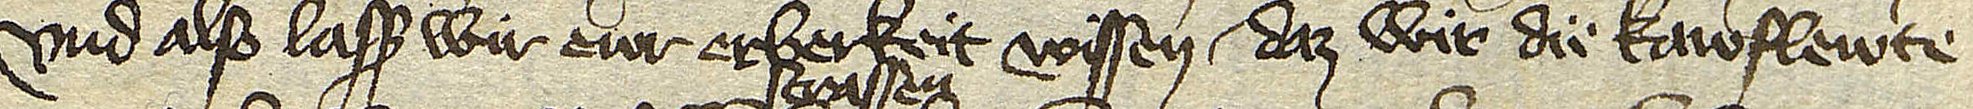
vnd alſo laſſ* wir ewr erberkeit wiſſen / daʒ wir die kawflewte
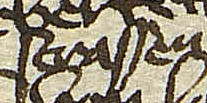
ſtraſſen
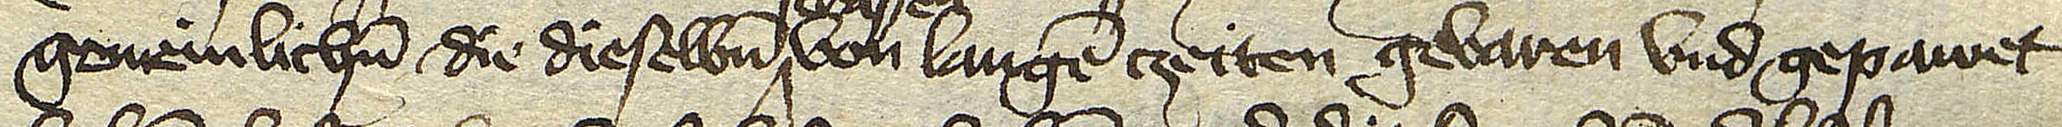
gemeinlichn* / die dieſelbn* von lange* cʒeiten gevaren vnd gepawet
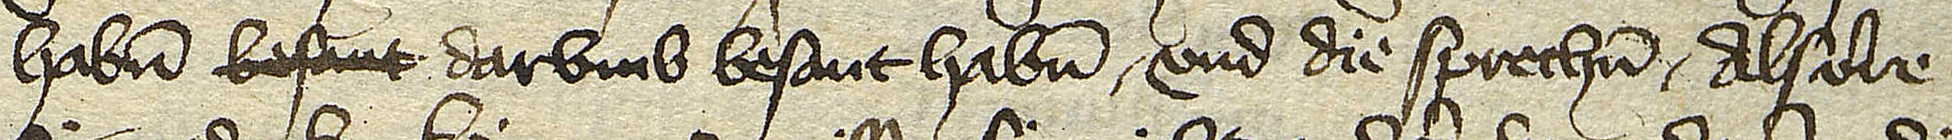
habn* beſant darvmb beſant habn* / vnd die ſprechn* / Alſv*re
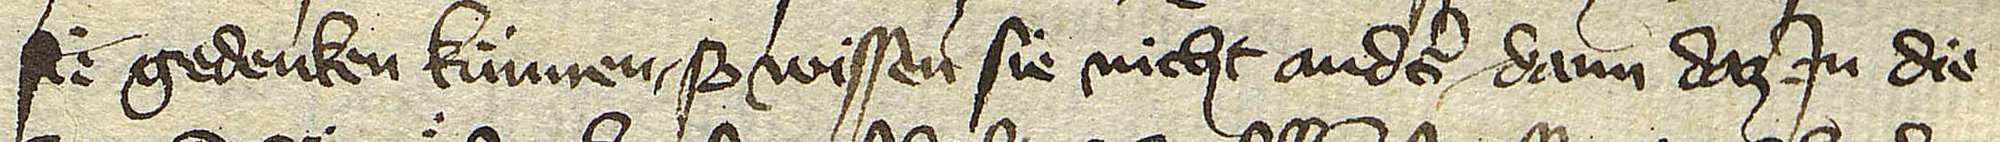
ſie gedenken künnen / ſo wiſſen ſie nicht ands* dann daʒ In die
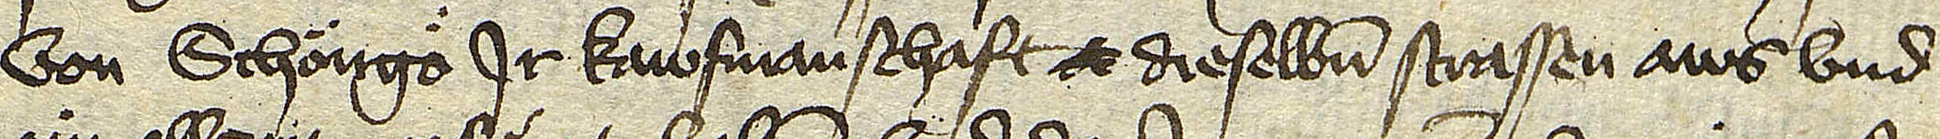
von Schöngö Ir kawfmanſchaft a dieſelbn* ſtraſſen aws vnd
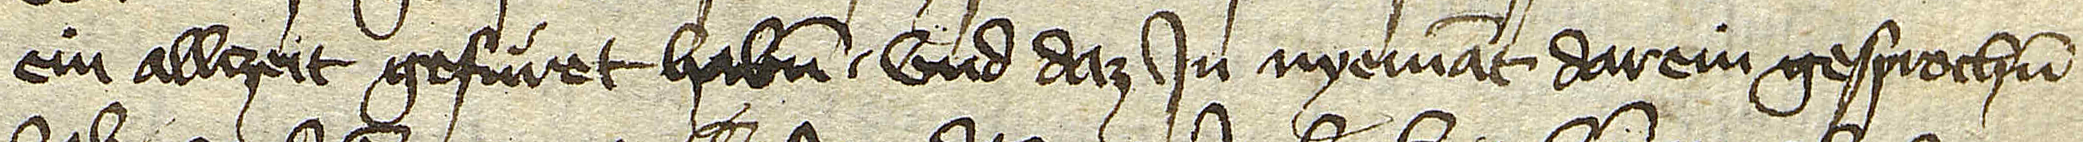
ein allcʒeit gefüret habn* / vnd daʒ In nyemat* darein geſprochn*
